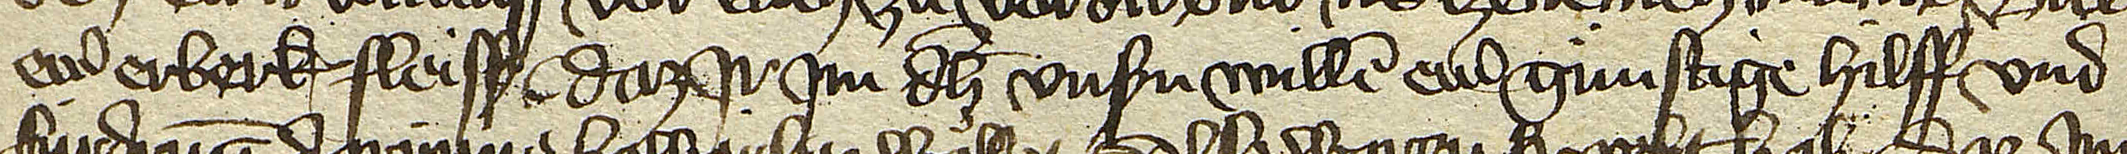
ew* erberk* fleiſſ* / daʒ Ir Im d*h vnſ*n wille* ew* günſtige hilff vnd
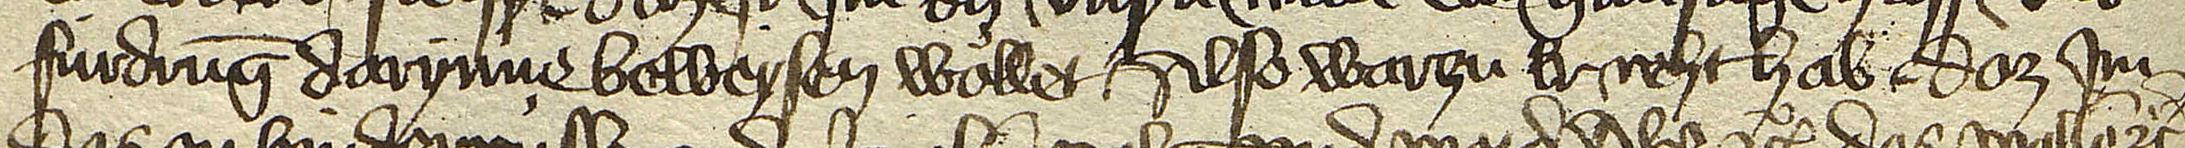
fürdrug* darynne beweyſen wöllet / Alſo warcʒu Er reht hab / daʒ Im
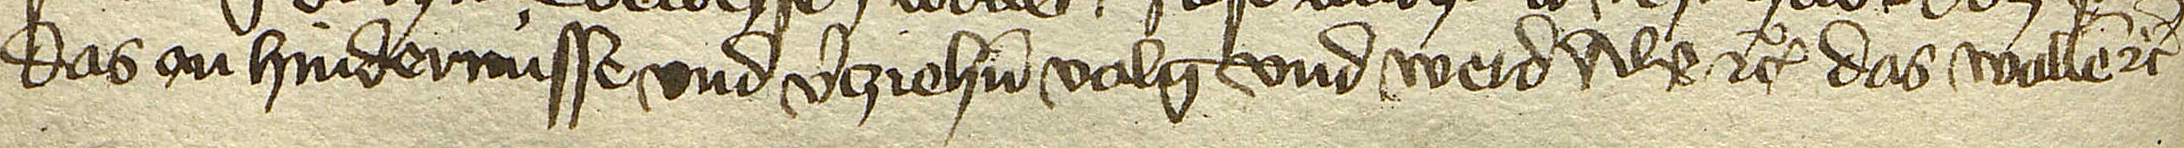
das on hindernüſſe vnd v*cʒiehn* volg vnd werd Als ec* das wolle* ec*
